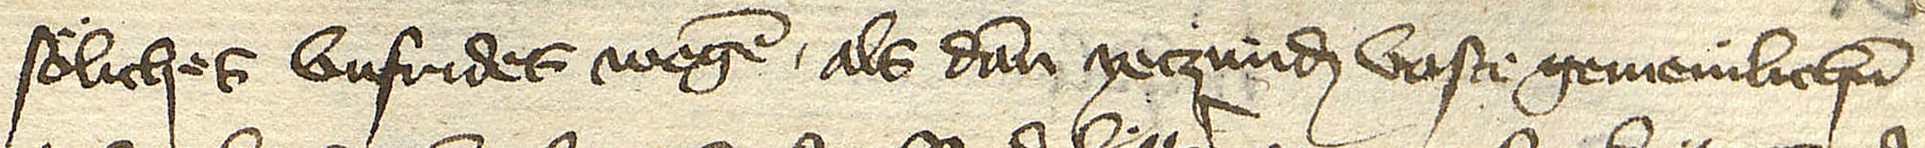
ſöliches vnfrides wege* / als dan* yecʒund* vaſte gemeinlichn*
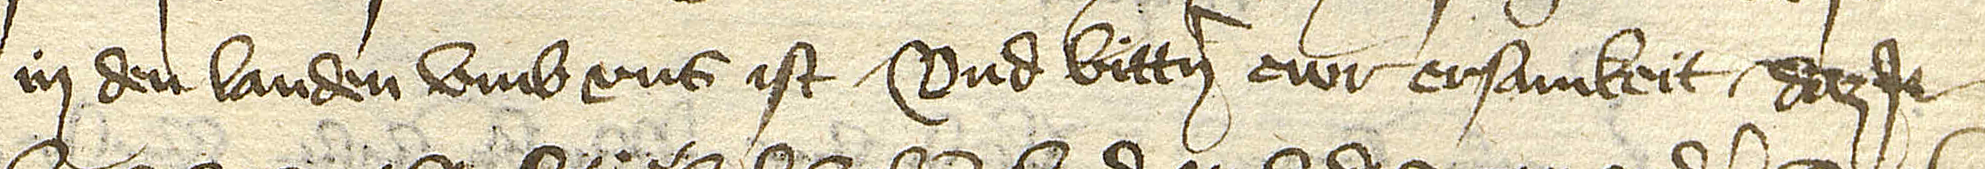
in den landen vmb vns iſt / Vnd bittn* ewr erſamkeit / daʒ Ir
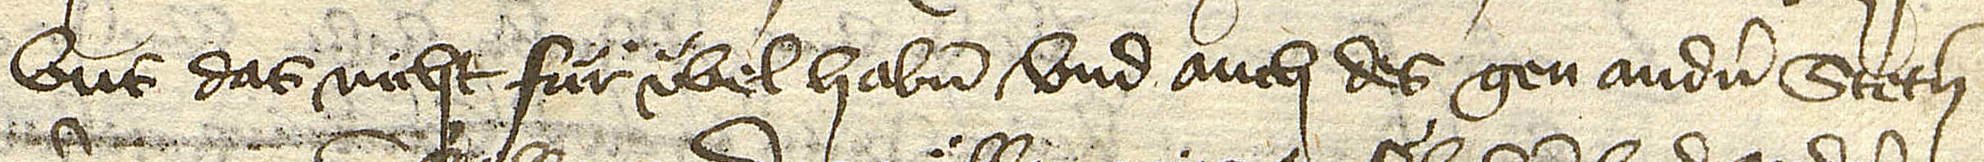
vns das nicht für v̈bel habn* / vnd auch des gen andn* Stetn*
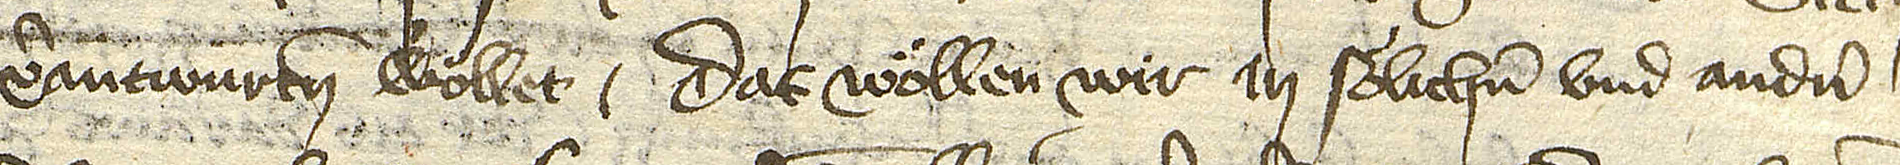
v*antwurtn* wöllet / Das wöllen wir in ſölichn* vnd andn*
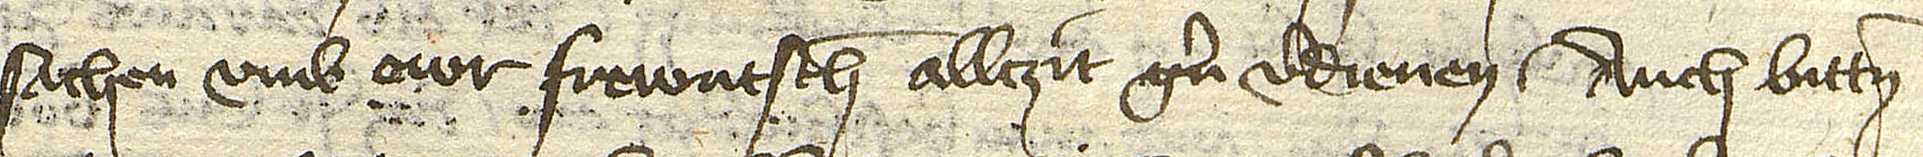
ſachen vmb ewr frewntſch* allcʒit g*n v*dienen / Auch bittn*
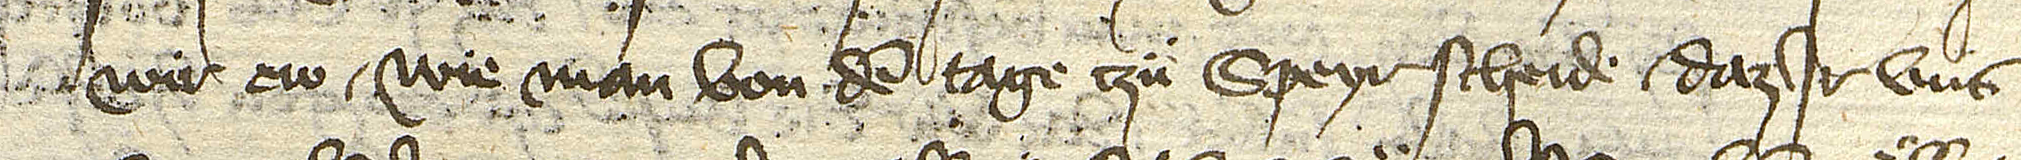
wir ew / wie man von d* tage cʒü Speyr ſcheide / daʒ Ir vns
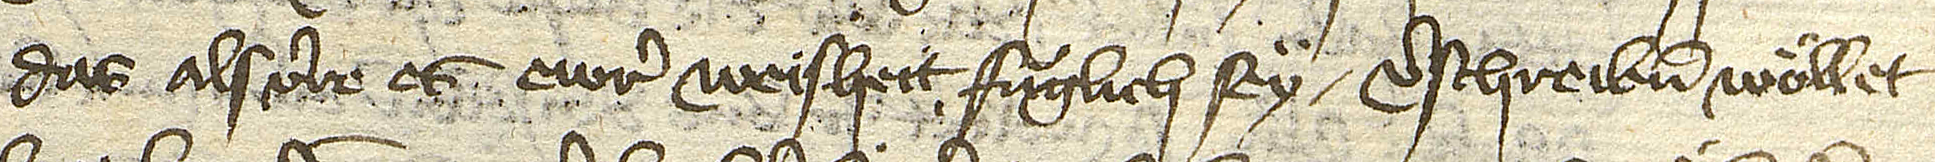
das alſ v*re es ewr* weiſheit füglich ſey / v*ſchreibn* wöllet
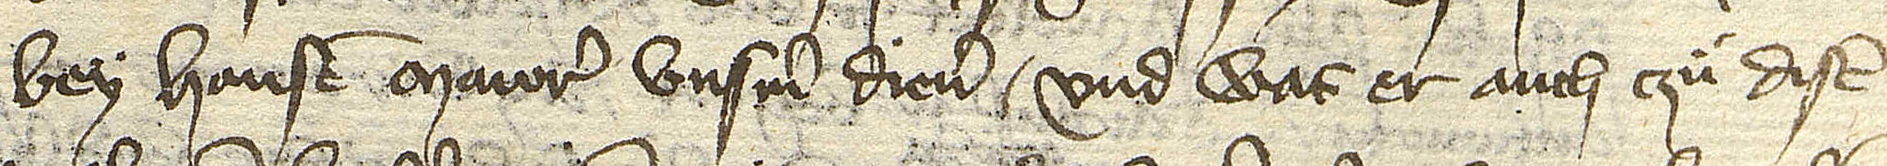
bey hanſe* Mawr* vnſm* dien* / vnd was er auch cʒü diſe*
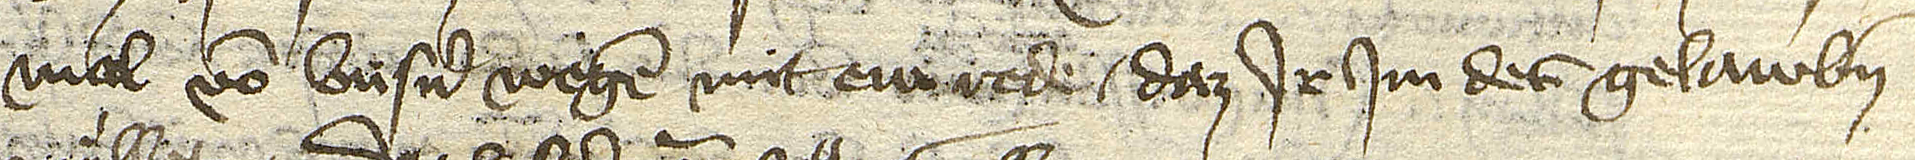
mal vo* vnſn* wege* mit ew rede / daʒ Ir Im des gelawbn*
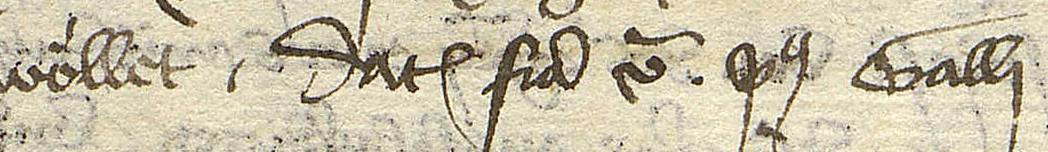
wöllet / Dat* fia* v* . p* Galli
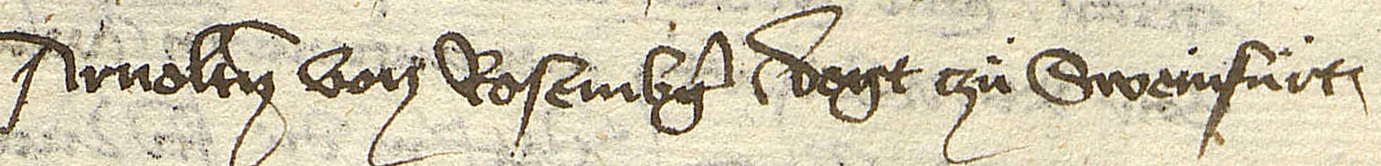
Arnoltn* von Roſembg* / vogt cʒü Sweinfürt
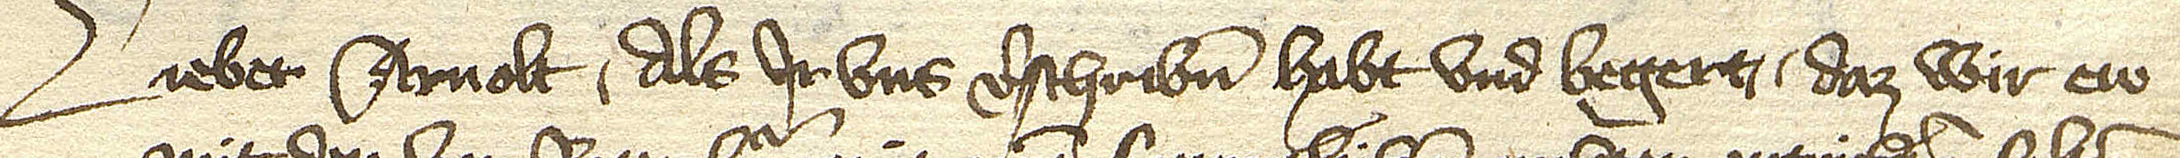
Lieber Arnolt / Als Ir vns v*ſchribn* habt vnd begert / daʒ wir ew
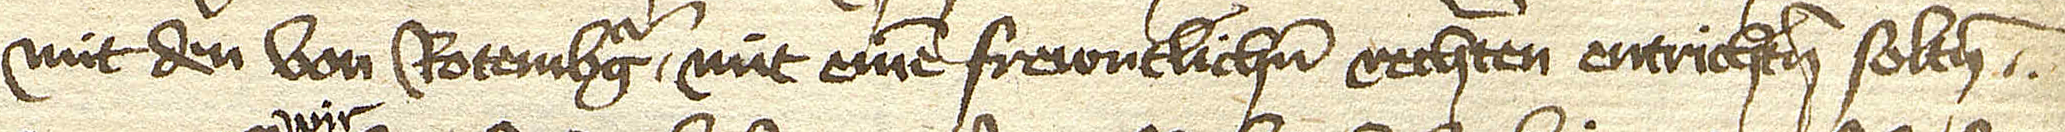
mit den von Rotembg* / mit eine* frewntlichn* rechten entrichtn* ſoltn* /.
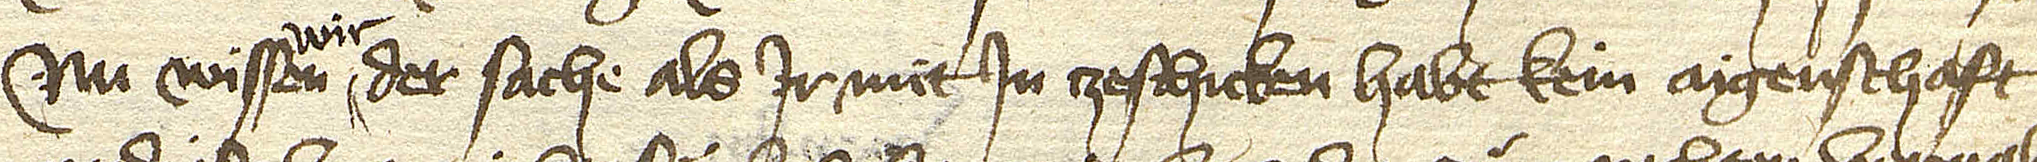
Nu wiſſen der ſache als Ir mit In cʒeſchicken habt kein aigenſchaft
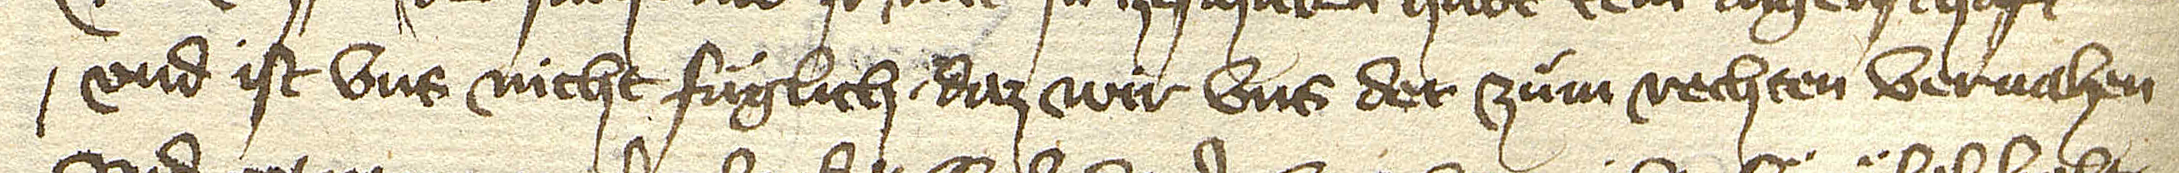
/ vnd iſt vns nicht füglich / daʒ wir vns der cʒüm rechten veruahen
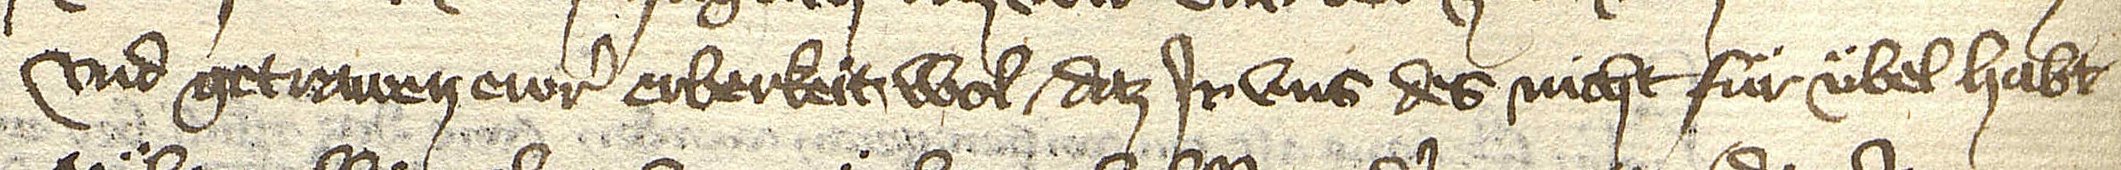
vnd getrawen ewr* erberkeit wol / daʒ Ir vns des nicht für v̈bel habt
